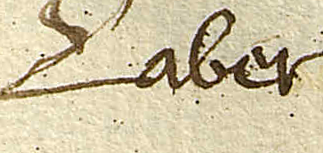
Laber
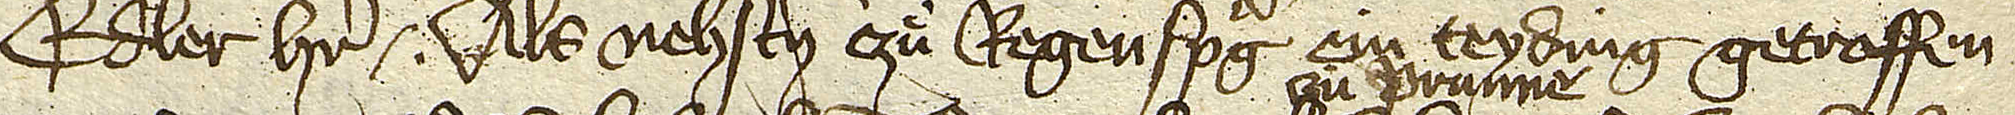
Edler hr* / . Als nehſtn* cʒü Regenſp*g ein teyding getroffen
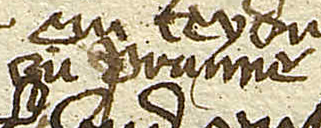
cʒü Prunne
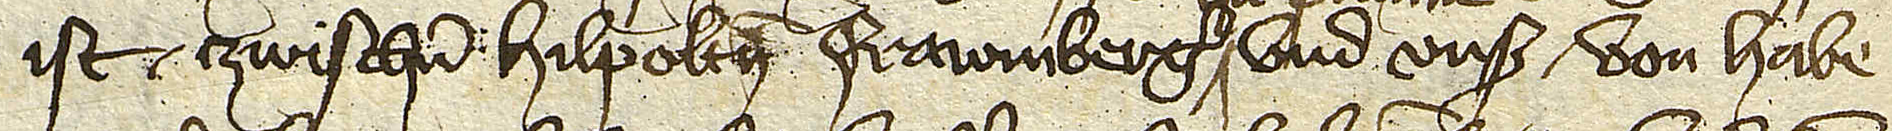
iſt / cʒwiſchn* hilpoltn* Frawmberg* vnd vnſ* / von habe
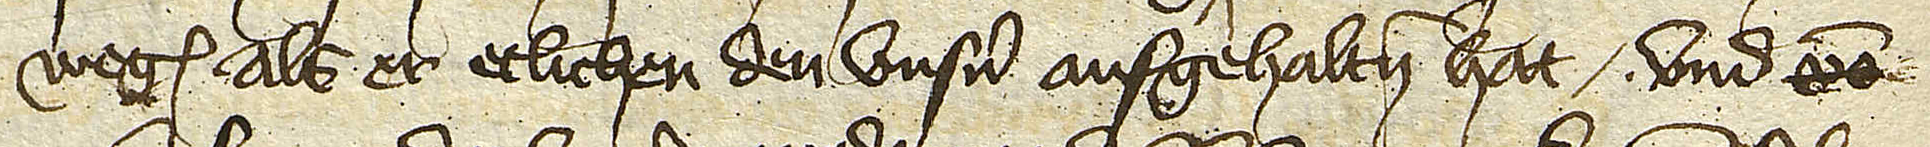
weg* / als er etlichen den vnſn* aufgehaltn* hat / . vnd vo*
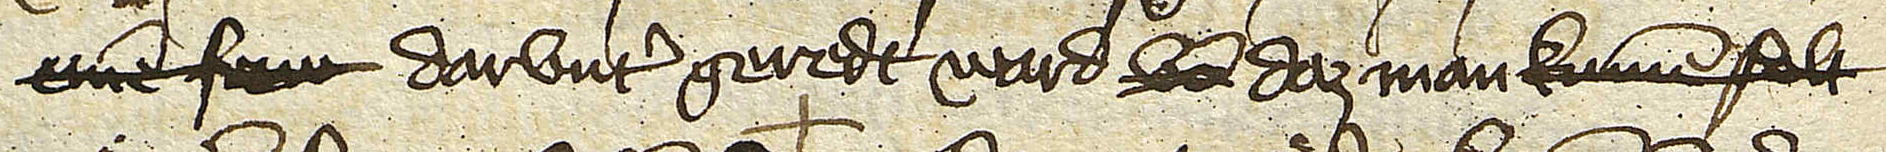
eine* fraw darvnt* geredt ward vo* daʒ man kume* ſolt
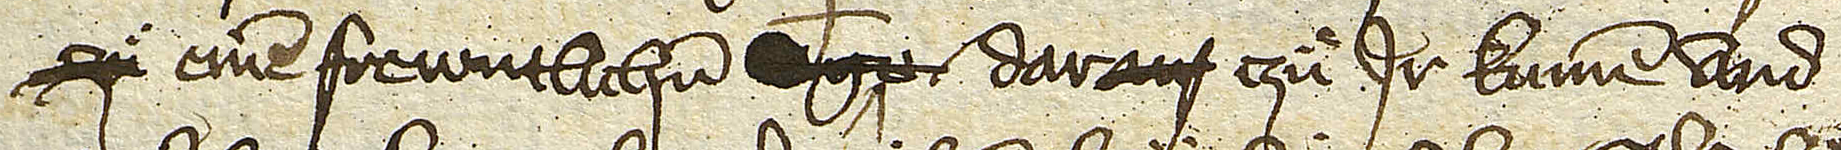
cʒü eine* frewntlichn* ge / darauf cʒü Ir kume* vnd
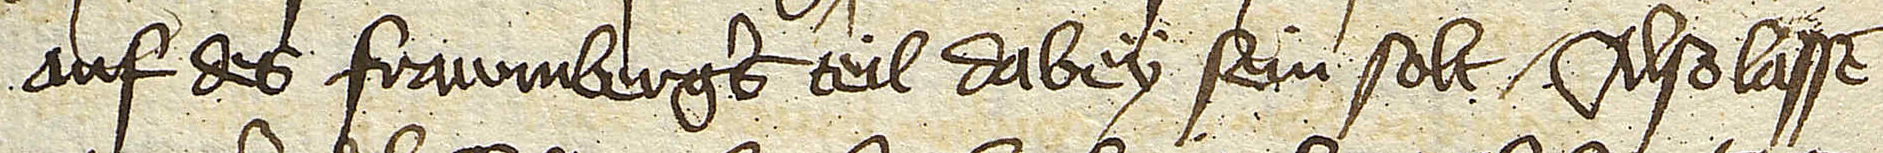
auf des frawmberg*s teil dabey ſein ſolt / Alſo laſſe*
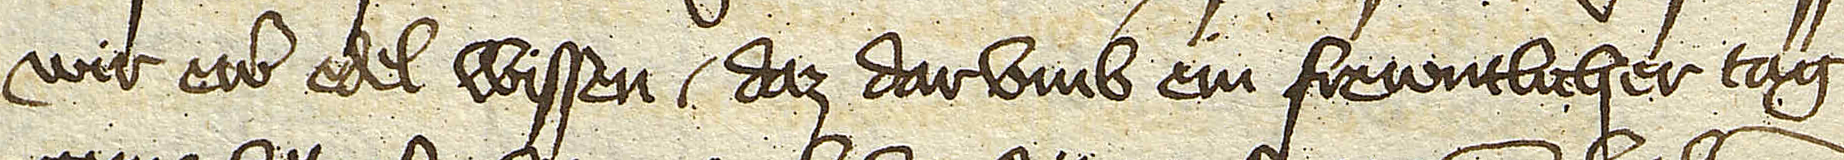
wir ew* edel wiſſen / daʒ darvmb ein frewntlicher tag
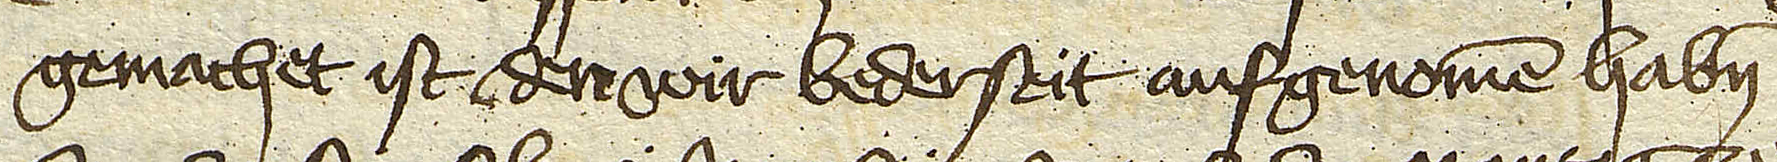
gemachet iſt / den wir beder ſeit aufgenome* habn*
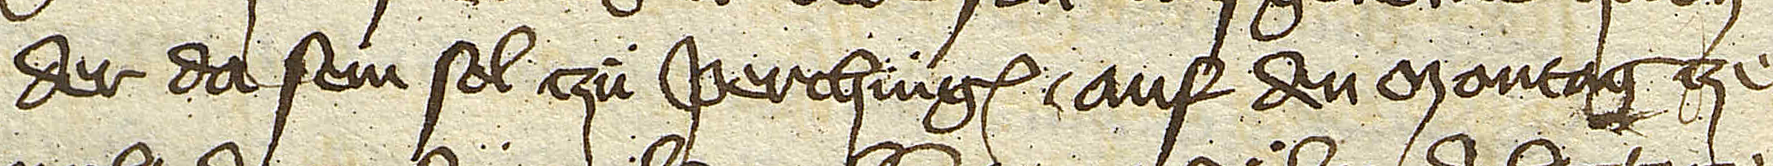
der da ſein ſol cʒü Perching* / auf den Montag cʒe
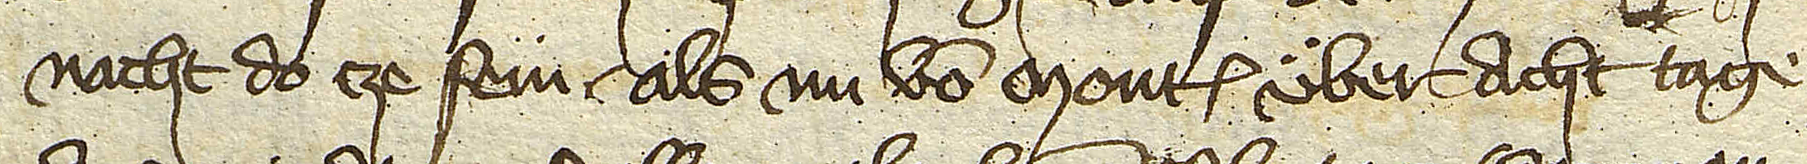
nacht do cʒe ſein / als nu vo* Mont* v̈ber Acht tage
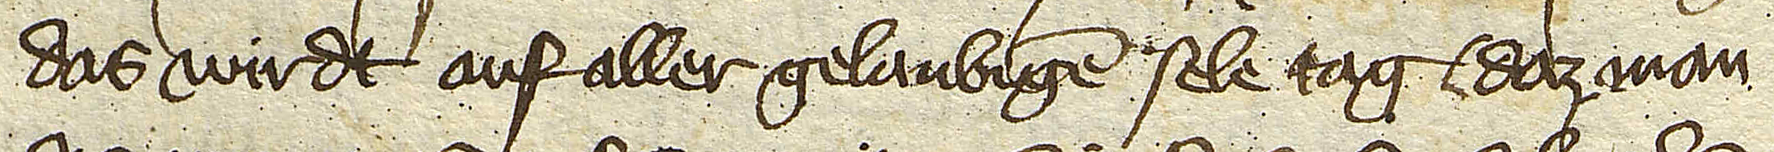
das wirdt auf aller gelaubige* ſele tag / daʒ man
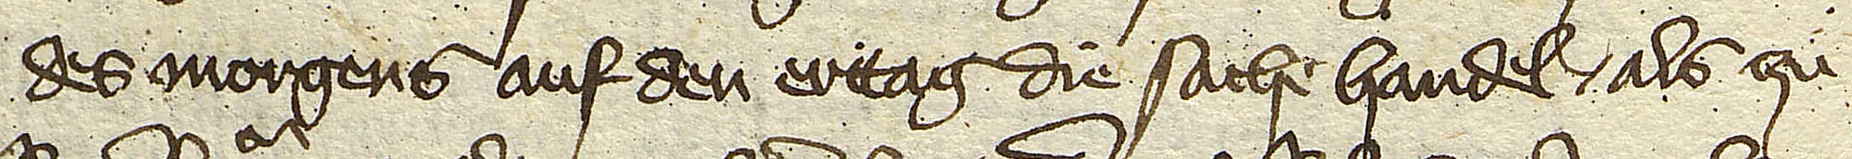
des morgens auf den eritag die ſache handel / als cʒü
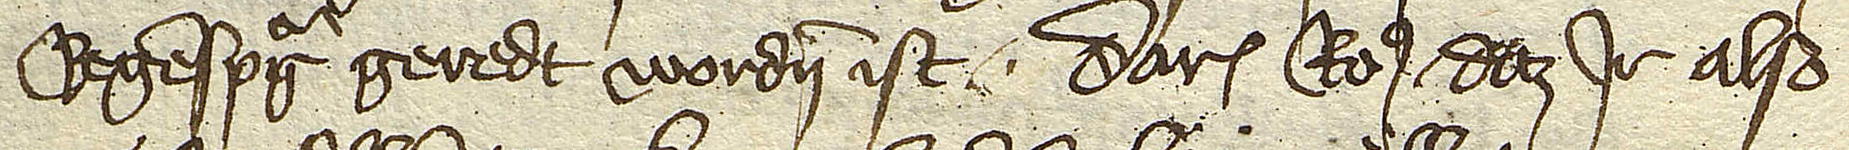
Rege*ſp*g geredt wordn* iſt / . Dar* Ro* / daʒ Ir alſo
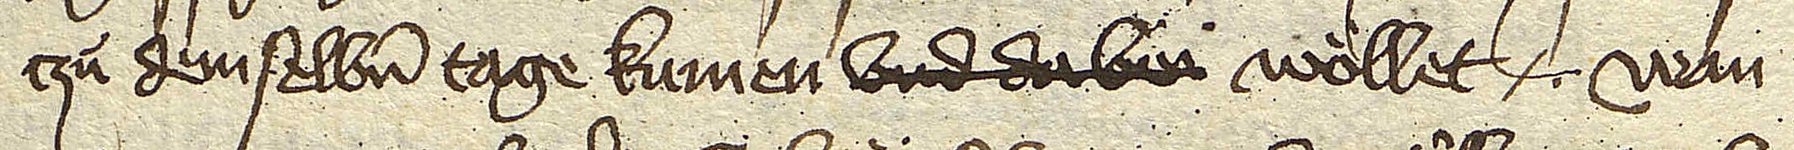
cʒü demſelbn* tage kumen vnd dabei wöllet / . wan
